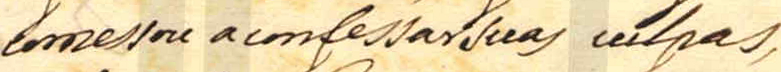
comessou a confessar suas culpas,
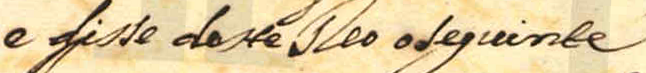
e disse deste Reo o seguinte.
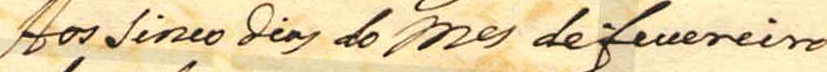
Aos sinco dias do mes de feuereiro
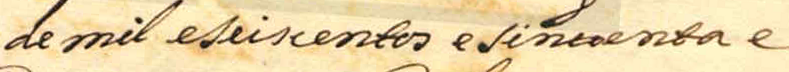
de mil e seiscentos e sincoenta e
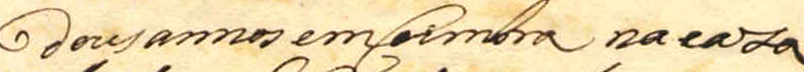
dous annos em Coimbra na caza
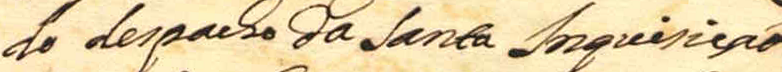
do despacho da Santa Inquisiçaõ
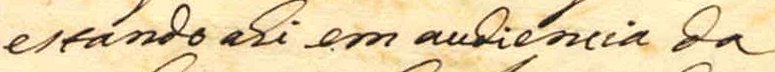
estando ahi em audiencia da
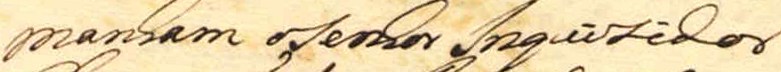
manham o senhor Inquizidor
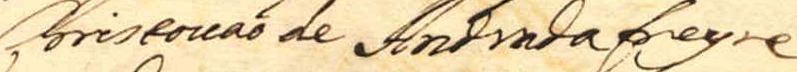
Christouão de Andrada freyre
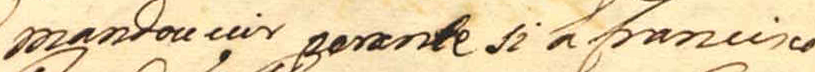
mandou uir perante si a francisco
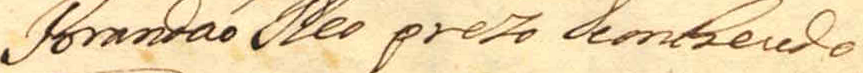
Brandão Reo prezo contheudo
